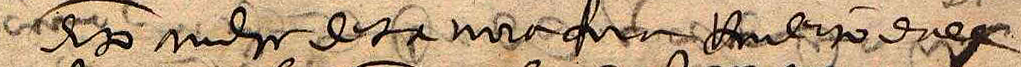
dito andre de tauora fora Rendeiro dall
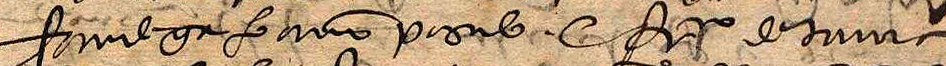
famdega ho anō pasado. e frco de tauora
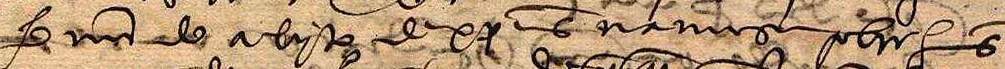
homē do abyto de xpūs na mesa sobre hūs
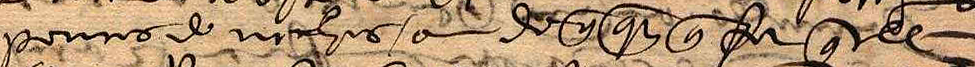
poucos de uinhos / ou do q̄ q̄r q̄ for q̄ elle
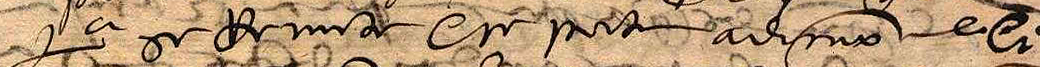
ta se Remete e reporta a dição do li
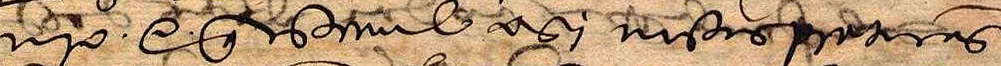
uro. e q̄ estamdo asy nestas praticas
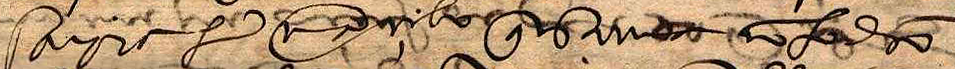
sayra hū mācebo q̄ estaua c̄o ho dtō
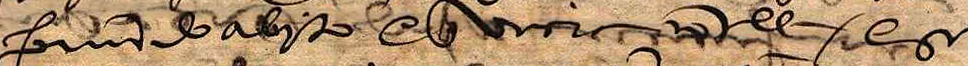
homē do abjto e q̄ viera cō elle / e se
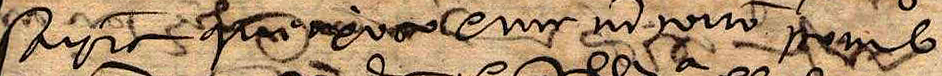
sayra queixoso e menēcorio pomdo
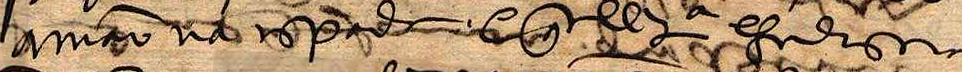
a mão na espada e q̄ elle ta lhe disera
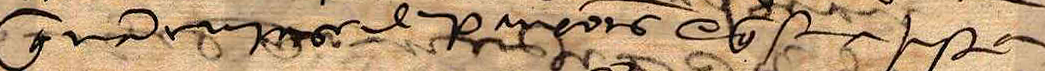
q̄ nā curase de paixões e q̄ se a Justa
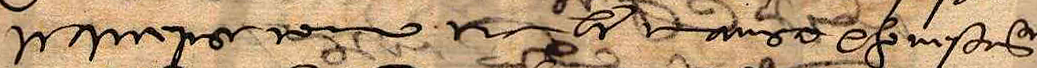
requerese como era bē mansa e honestamte
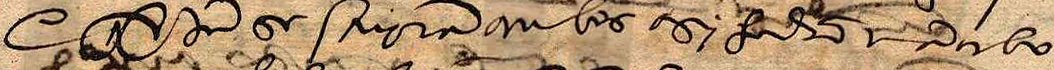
e q̄ entā se sayrā ambos asy ho dtō mācebo
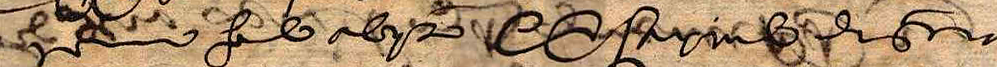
como ho do abyto e ē saymdo disera
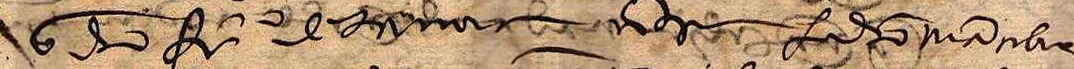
o dt̄o frco de tauora cōtra ho dtō mācebo
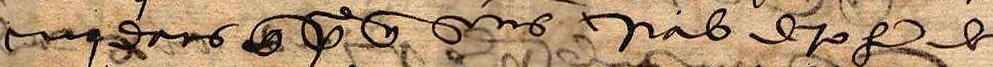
cuydaes q̄ p̄oq̄ soees criado de Johā de
